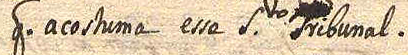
q̄. acostuma esse S.to Tribunal.
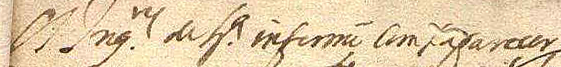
Os Inq.res de Lx.a informē com sa pareçer,
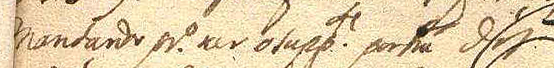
mandando pr.o uer o supp.te por hū dos
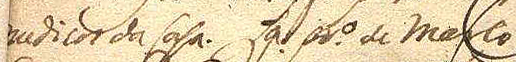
medicos da Casa. La. pr.o de março
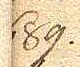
689.
